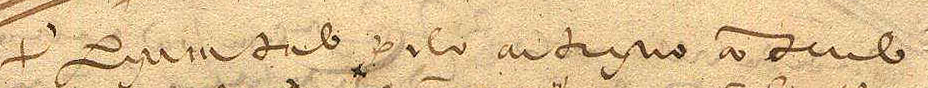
item ꝑgumtado pelo artiguo cōteudo
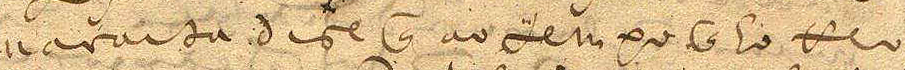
na carta dise q̄ ao tempo q̄ o Reo
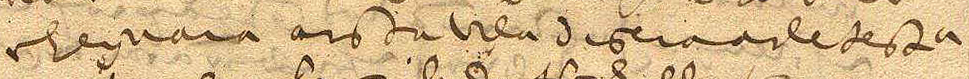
cheguara a esta vila disera a ele testa
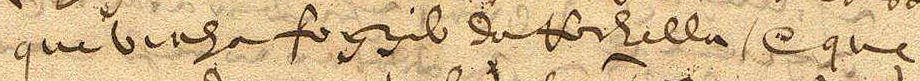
que vinha fogydo da Rochella / e que
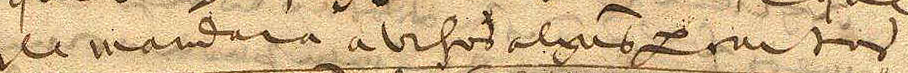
ele mandara avisos algus̄ ꝑ cartas
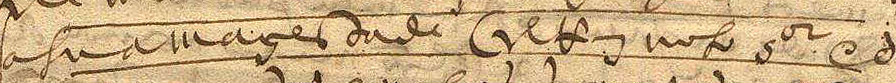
a sua magestade El Rej noso sor e di
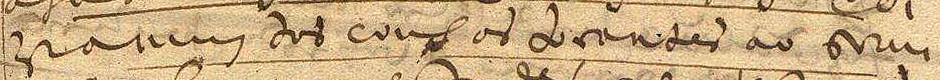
zia mujtas cousas tocantes ao serui
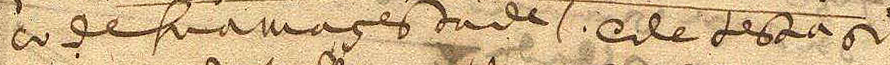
ço de sua magestade /. e ele testa sē
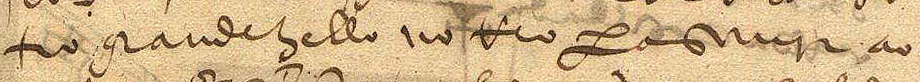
tio grande zello no Reo ꝑa serujr ao
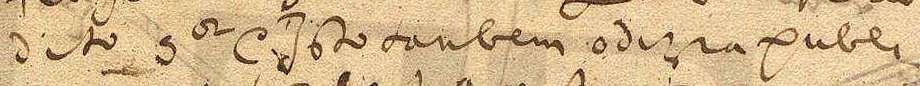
dito sor e Jsto tambem o dizia publi
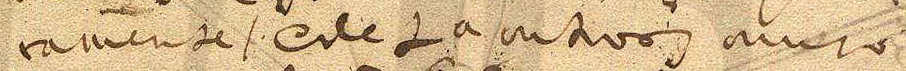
camente /. e ele ta outrosy ouuio
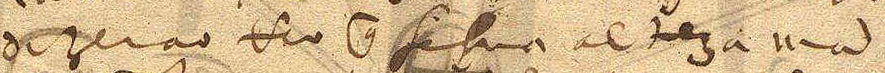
dizer ao Reo q̄ se sua alteza mā
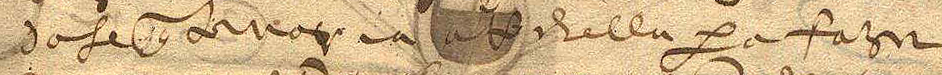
dase q̄ tornaria a Rochella ꝑa fazer
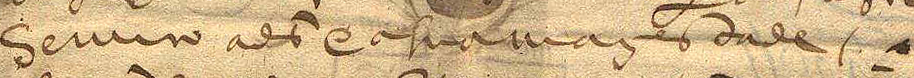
seruiçoo a ds̄ e a sua magestade / e
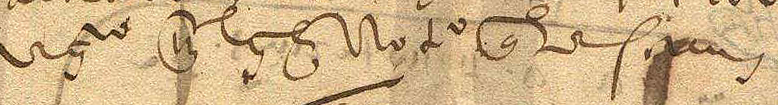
vigro mel glz̄ Noto q̄ ho escreuj
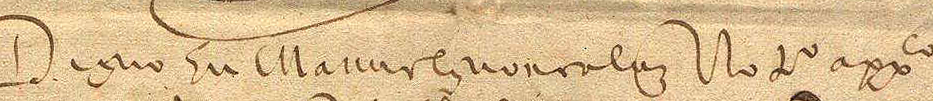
Diguo Eu Manuel guonçaluz̄ Notro appco
